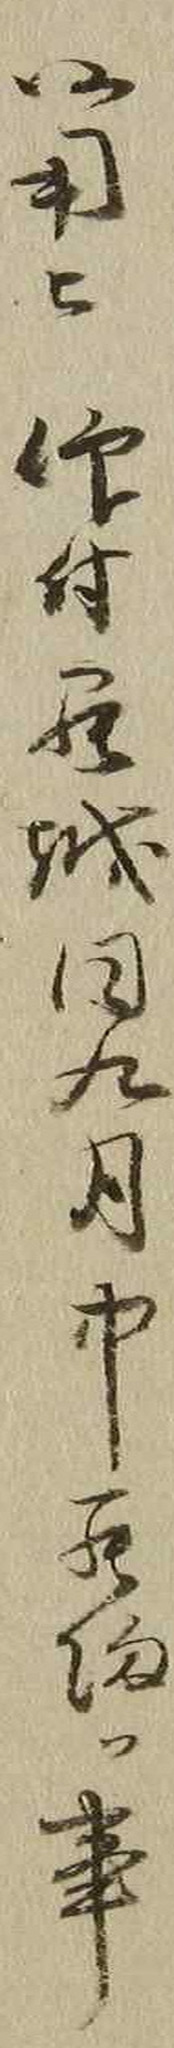御用被仰付罷越同九月中罷帰候事
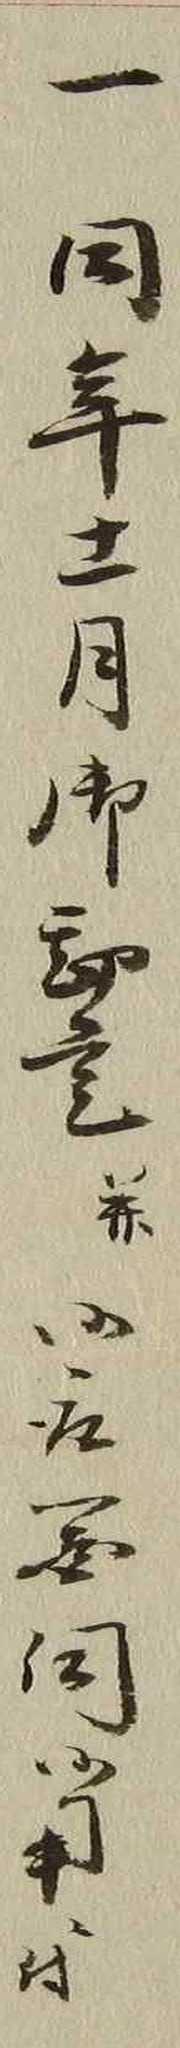一同年十一月御勘定并御取箇伺御用ニ付
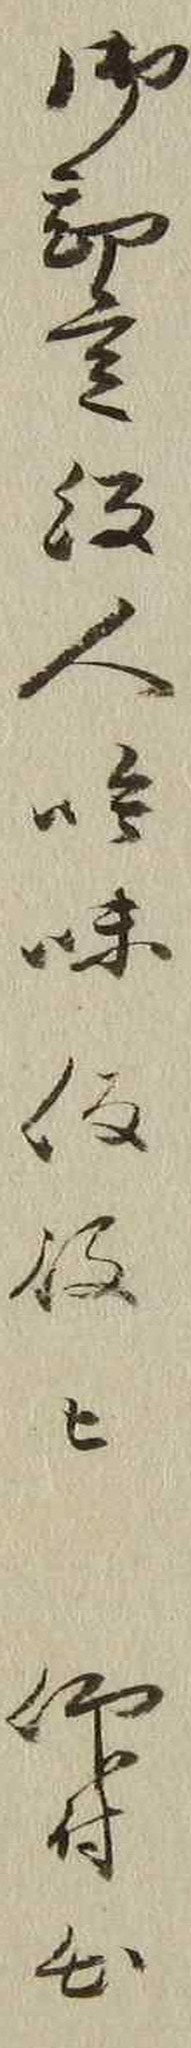御勘定役人吟味仮役被仰付出
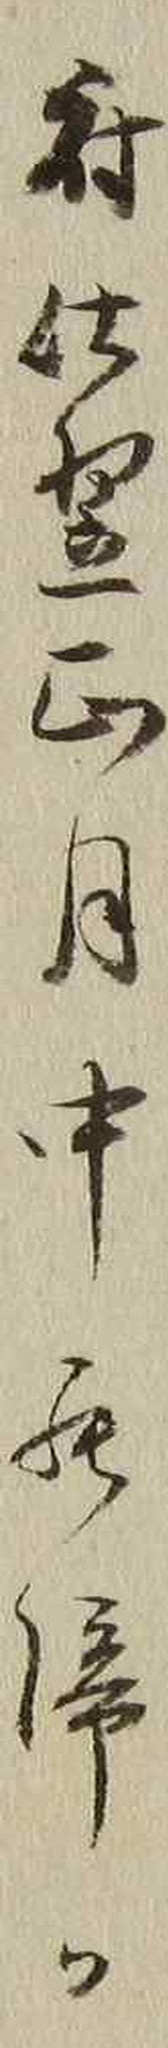府仕翌正月中罷帰候
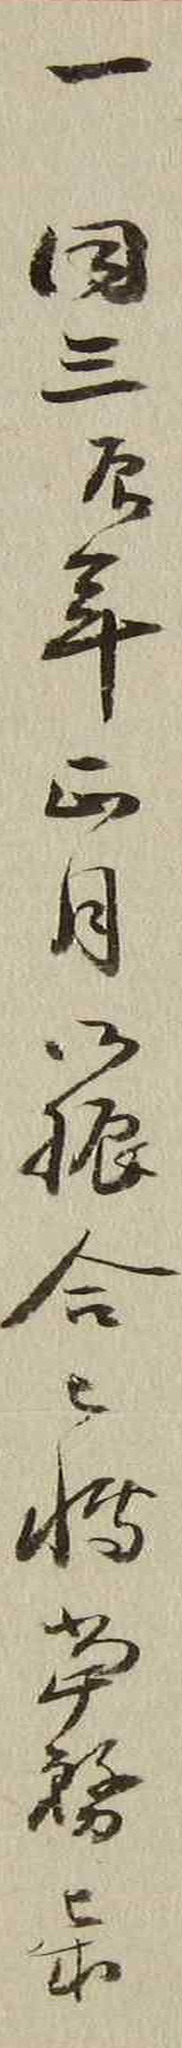一同三辰年正月御振合被転当務被成
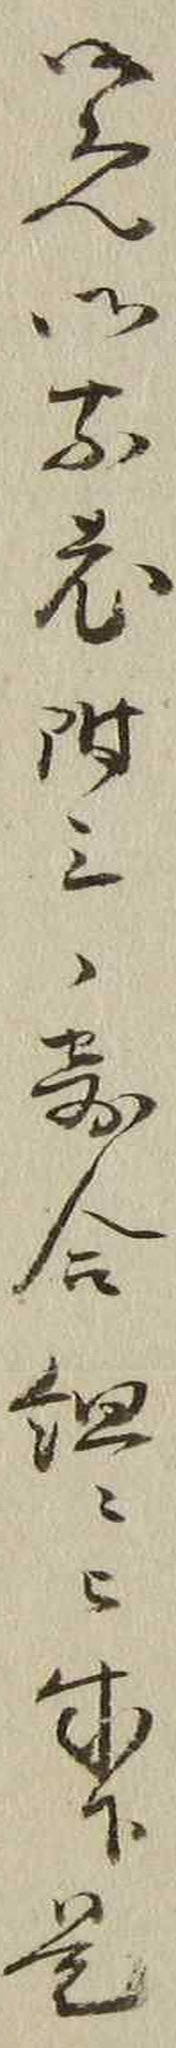御免御家老附三ノ寄合組ニ被成下是
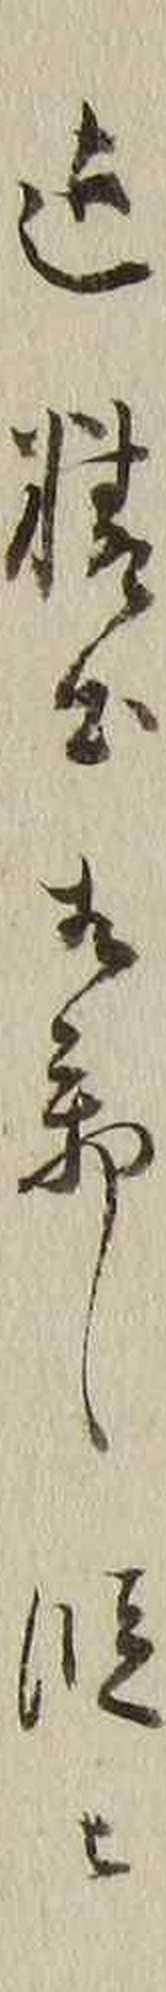迄精出相勤候段被
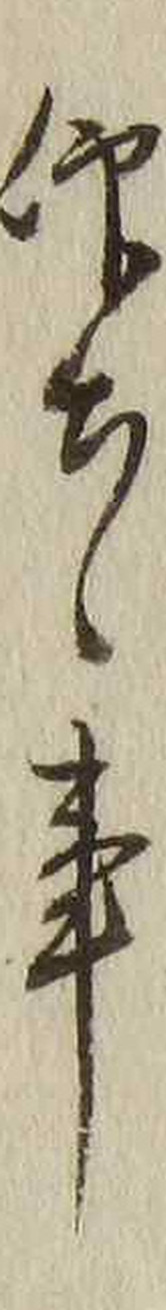仰出候事
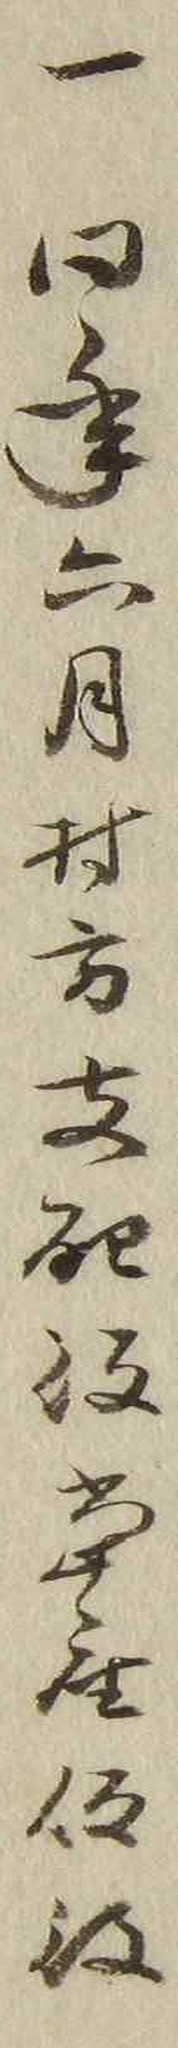一同年六月村方支配役当座仮役

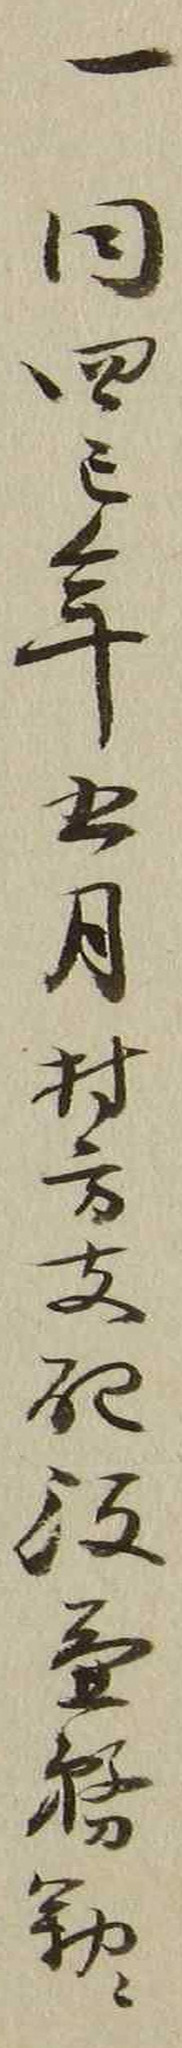一同四巳年五月村方支配役兼務勤ニ
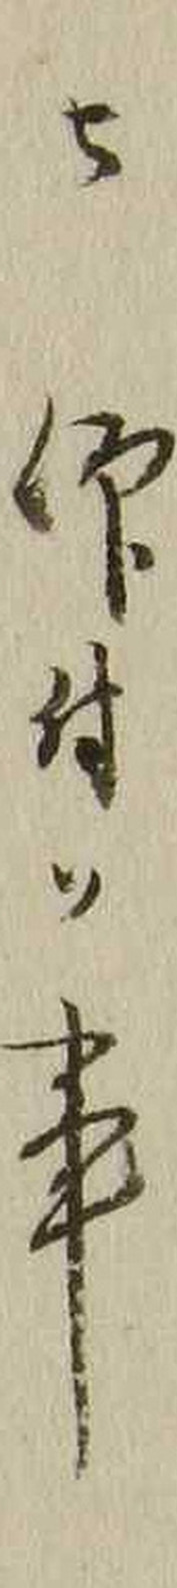被仰付候事
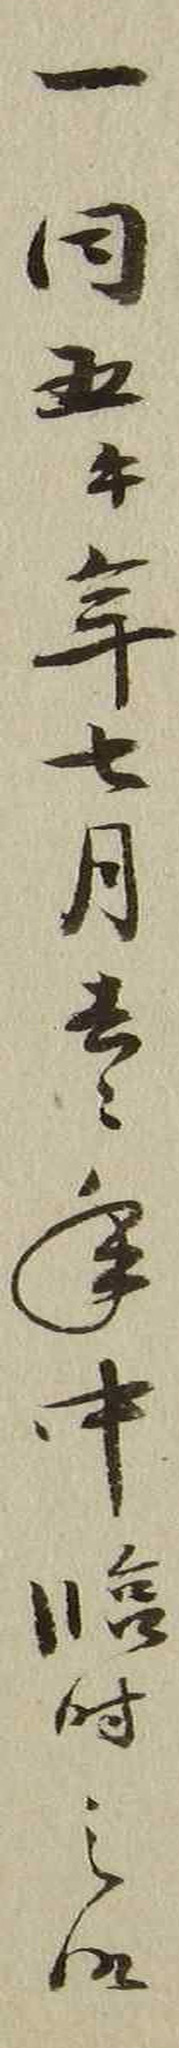一同五午年七月去々年中臨時之御
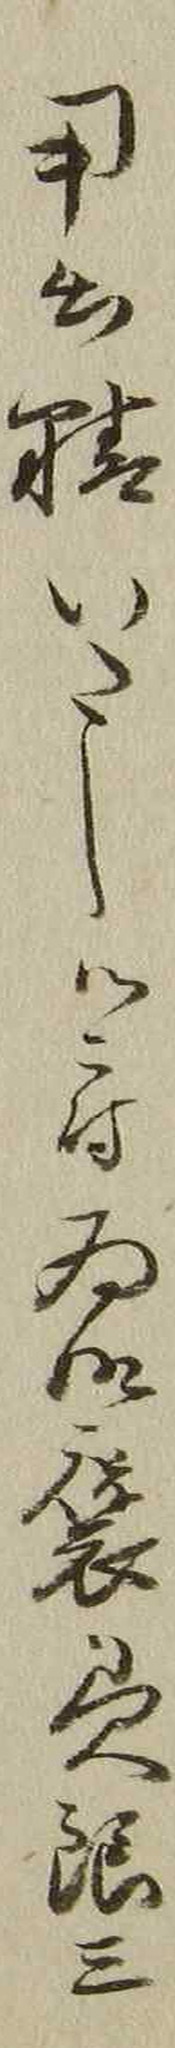用出精いたし候ニ付為御褒美銀三
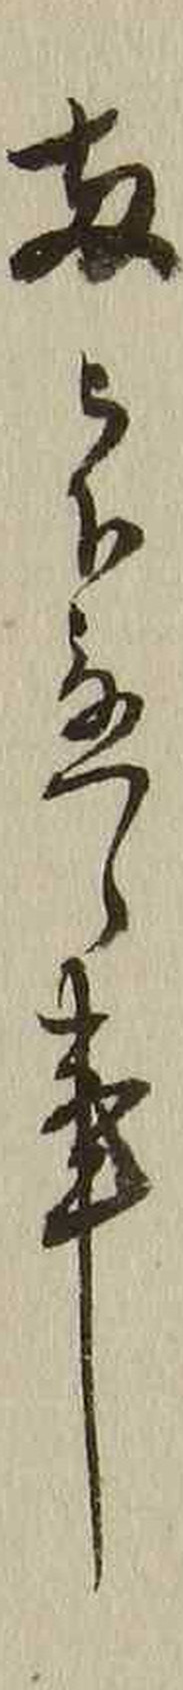両被下置候事
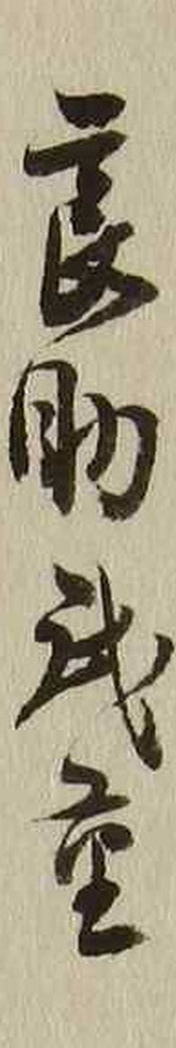良助武重
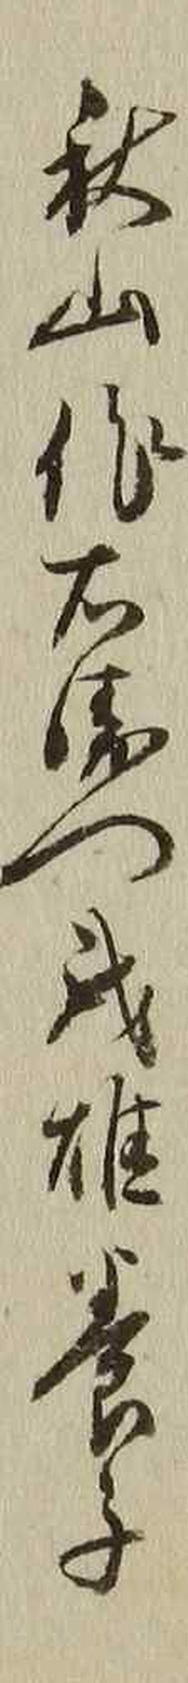秋山作右衛門武雄養子
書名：諸士系譜　巻之236　ふ之部4
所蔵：会津若松市立会津図書館
